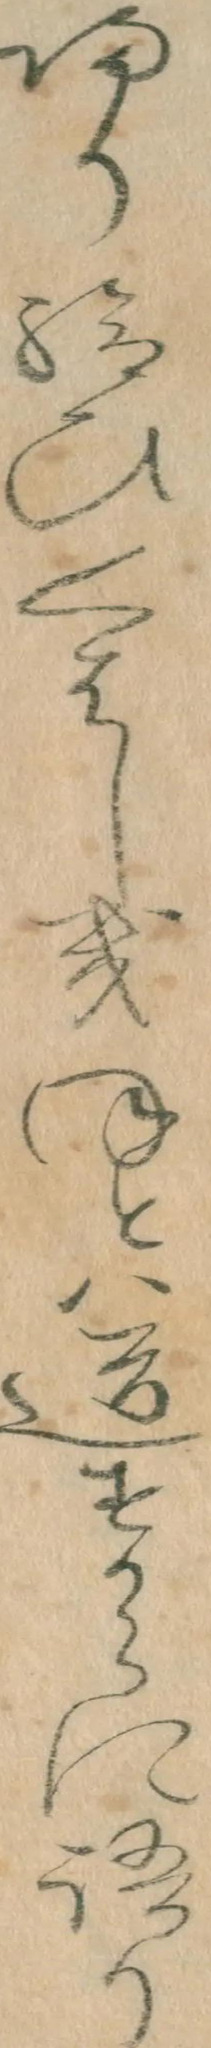帰り給ひくはしきほとは道すからに語り
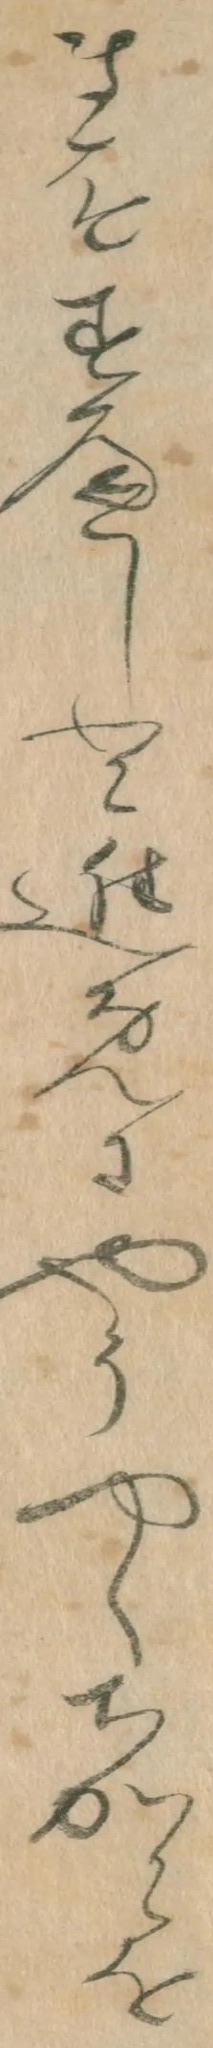まをすへしと進めにやうやくちからを
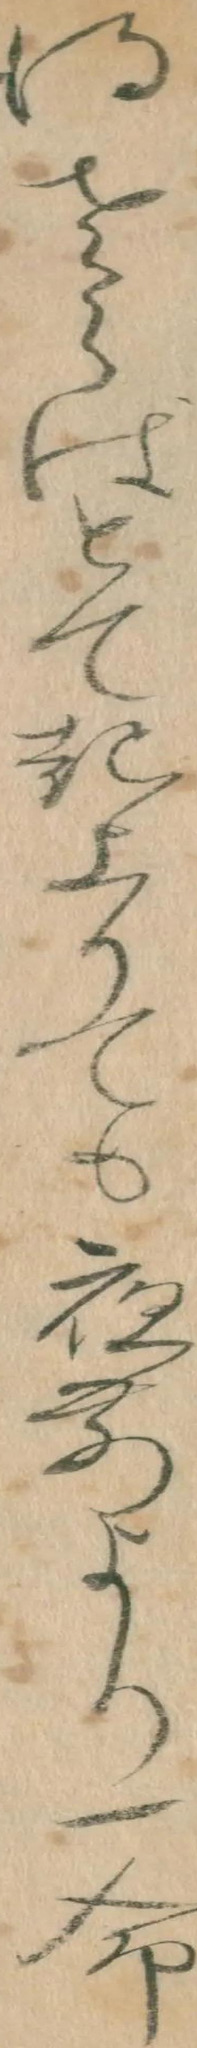得さらばとて起上りても夜前より一命
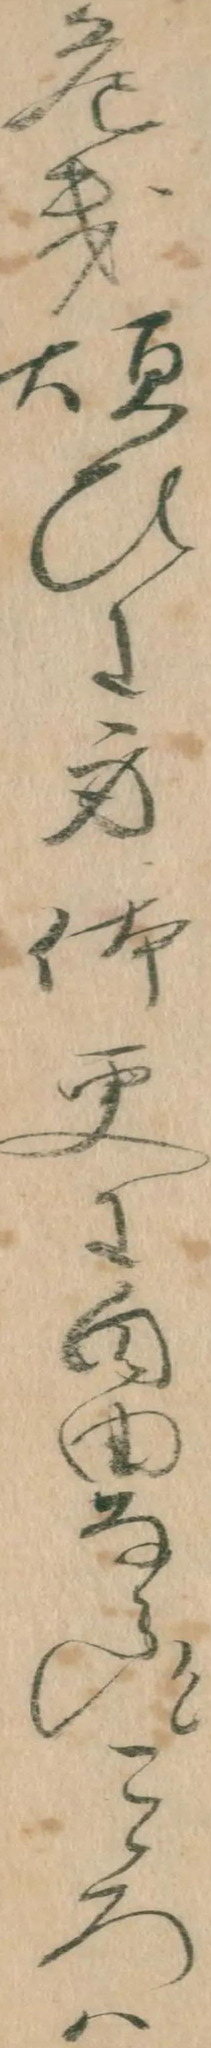危き煩ひに身体更に自由ならすこゝろは
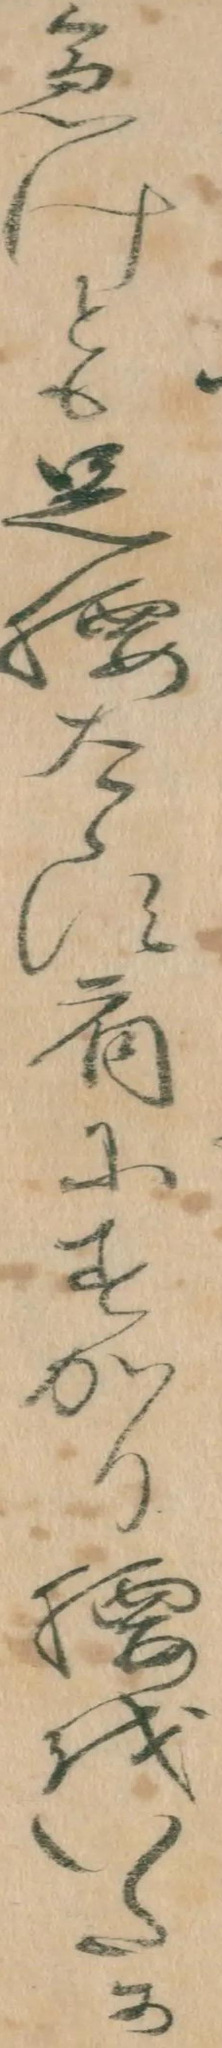急けとも足腰たゝす肩にすがり腰をいたか
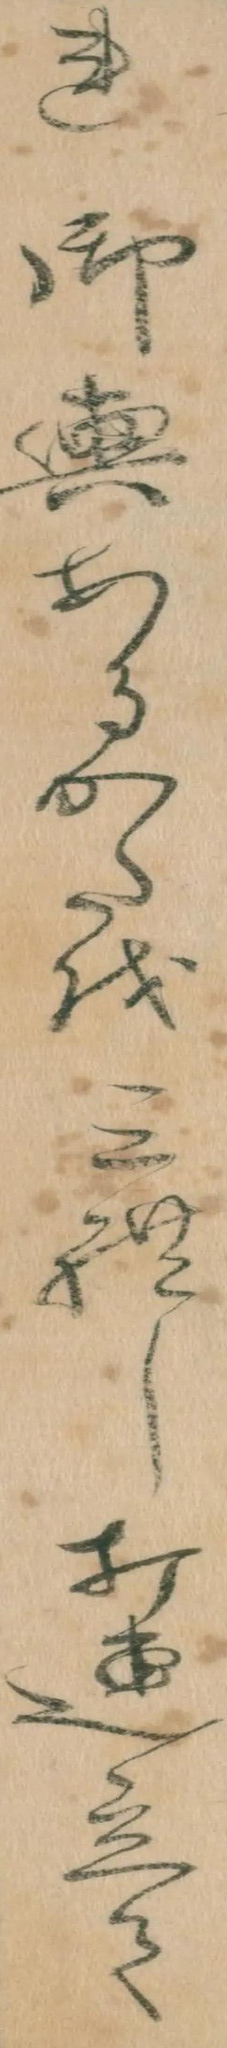れ神輿あるかたを三礼し打連立て
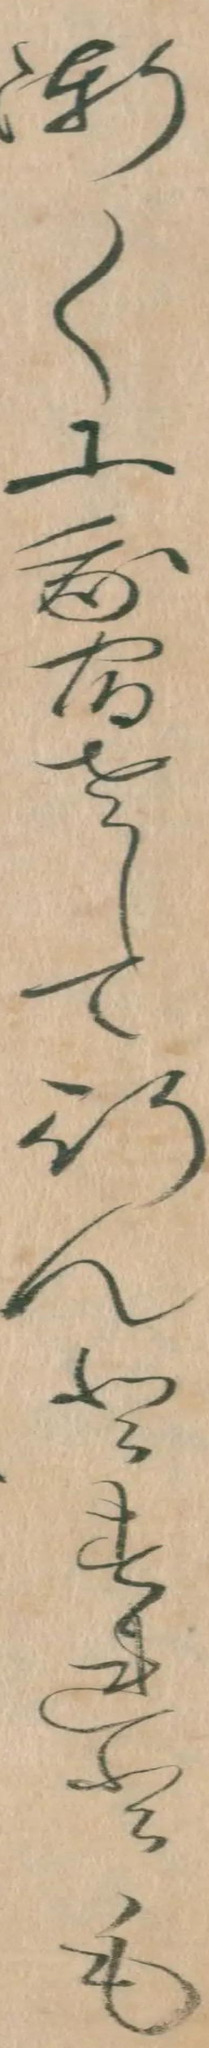漸〳〵に我宿さして行んとすれとも
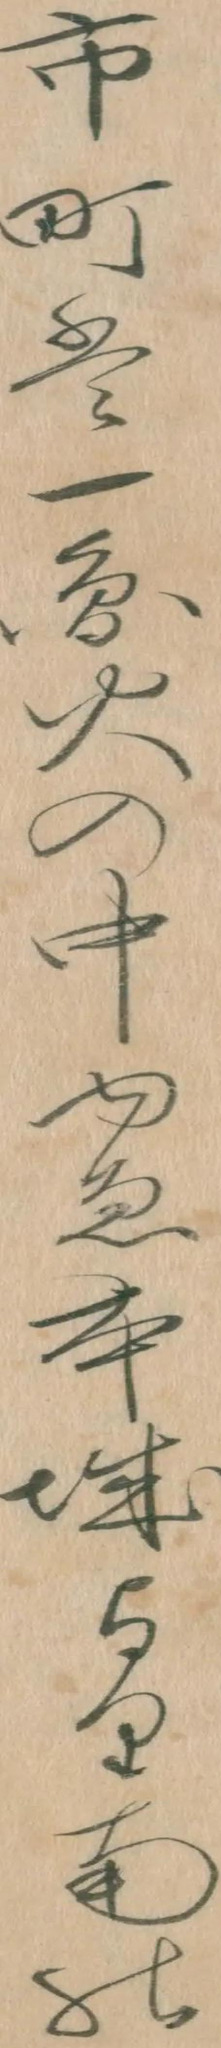市街は一円火の中ゆゑ本城より南の
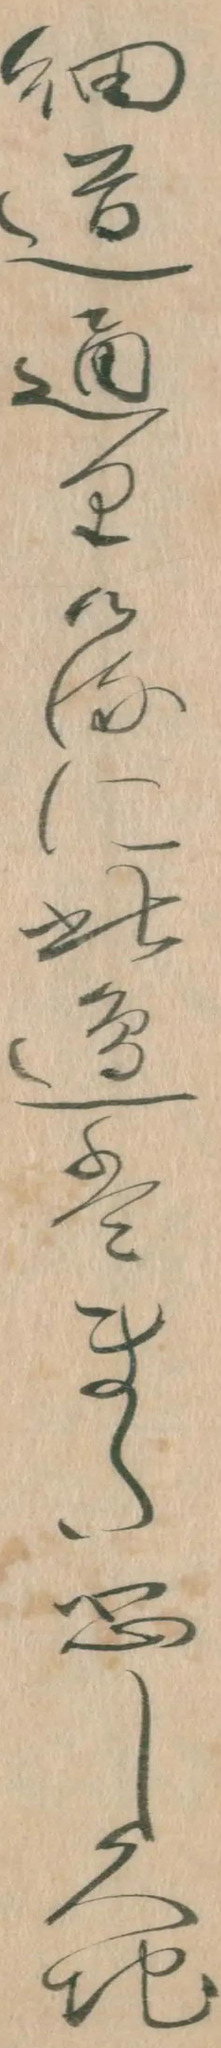細道通りけるに此辺はまた恐しく地
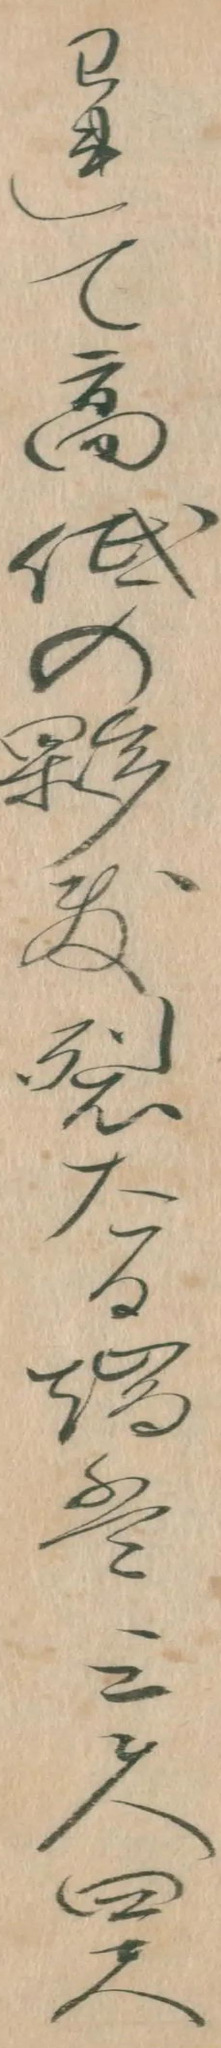われて高低の夥敷裂たる端は三尺四尺
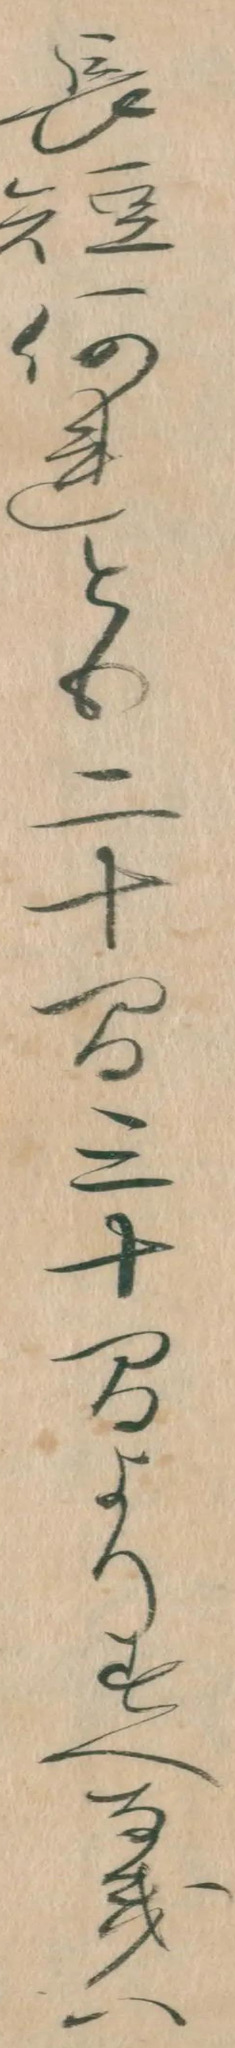長短何れとも二十間三十間よりすへなきは
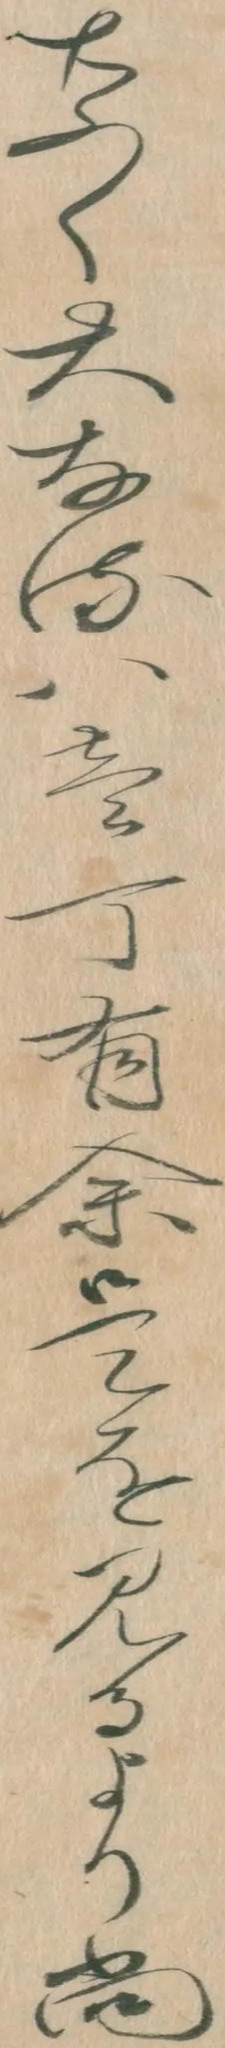なく大なるは壱丁有余是を見るより尚
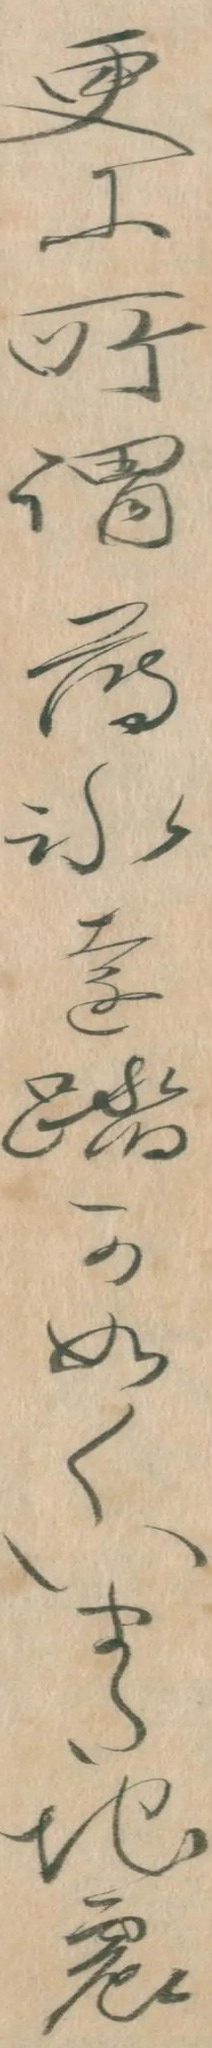更に所謂薄氷を踏か如くいまた地震
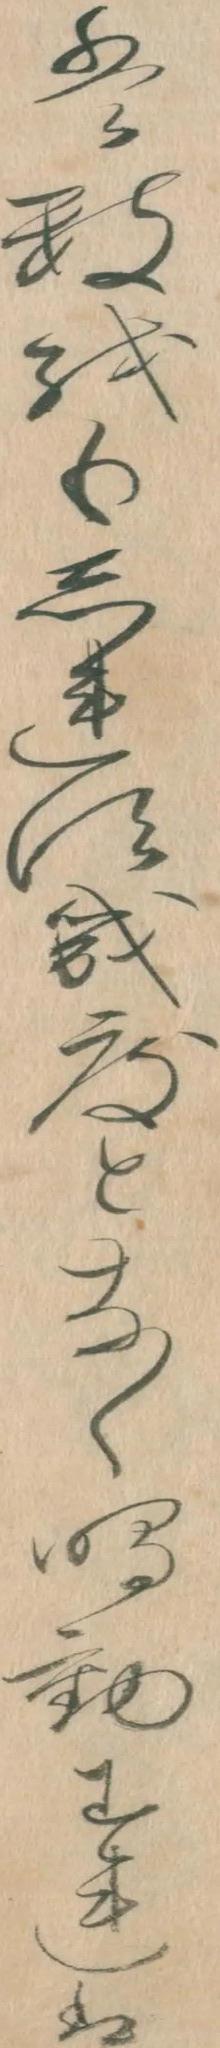は数をもしれす幾度となく鳴動すれは
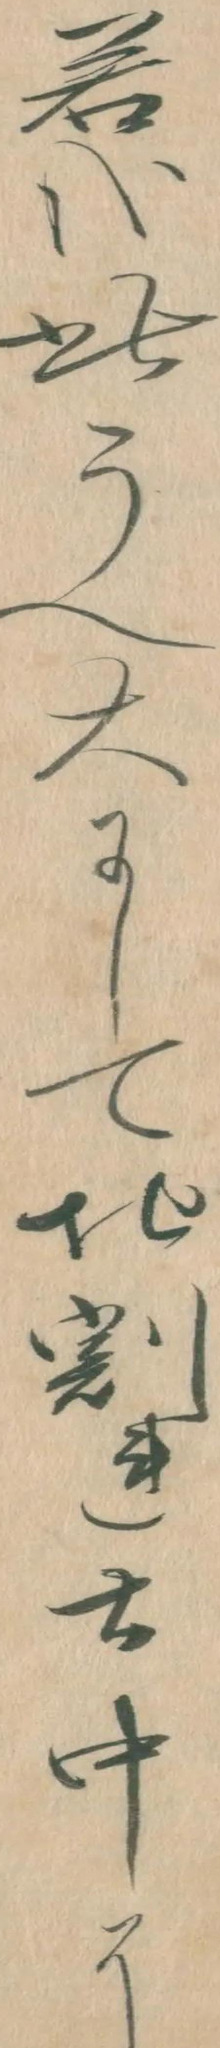若哉此うへ大にして地割れ土中に
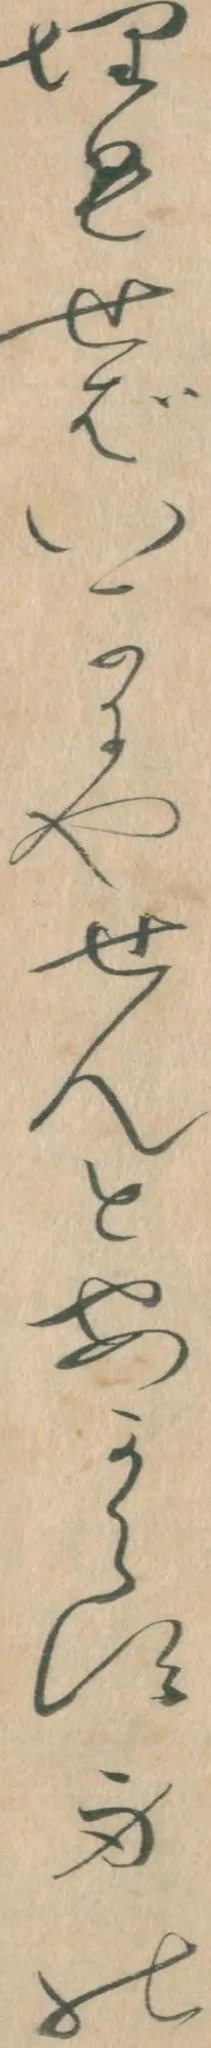埋れせばいかにやせんと安からす身の
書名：俗語之種. [4]
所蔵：国立国会図書館 National Diet Library, JAPAN
